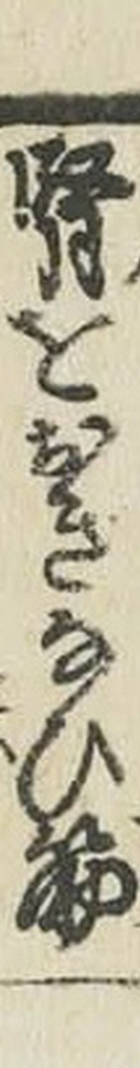腎をおぎなひ筋
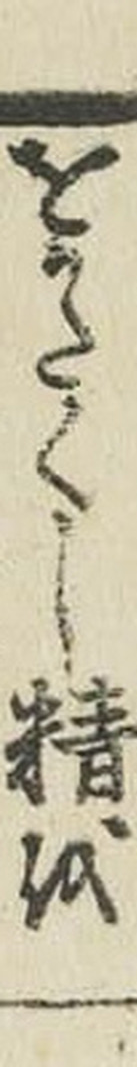をかたくし精を
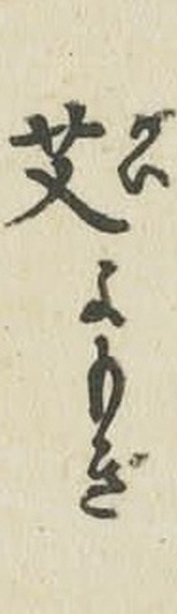艾よもぎ
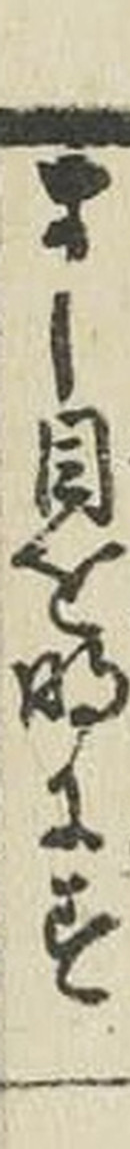まし目を明にす
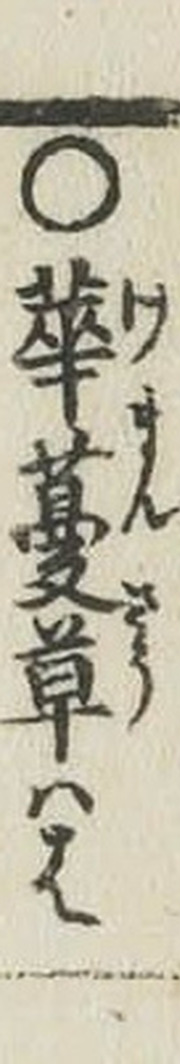○華鬘草はは
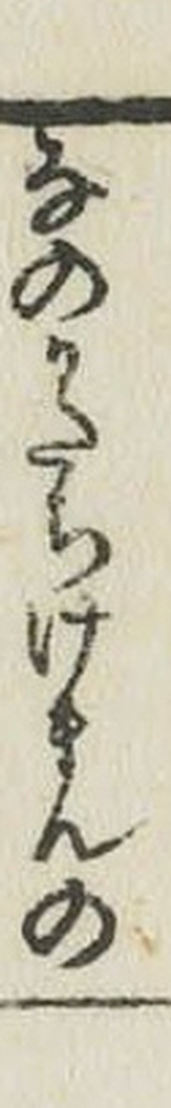なのかたちけまんの
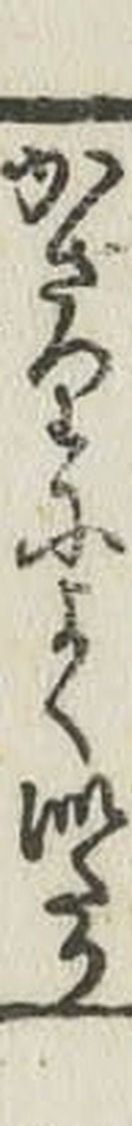かざりによく似たり
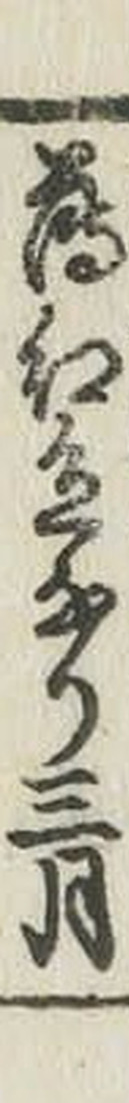薄紅色なり三月
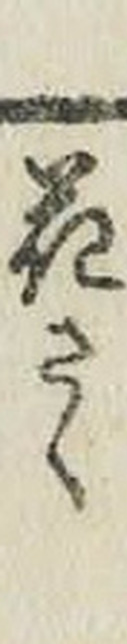花さく
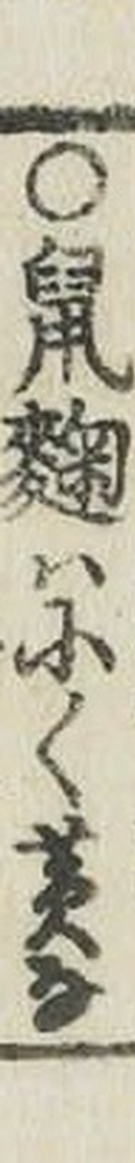○鼠麹は小く黄な
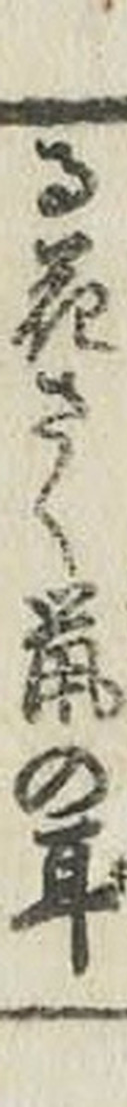る花さく鼠の耳
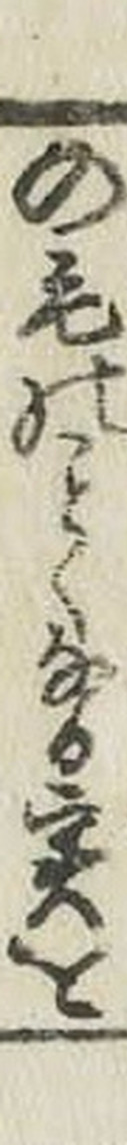の毛のことくなる実を
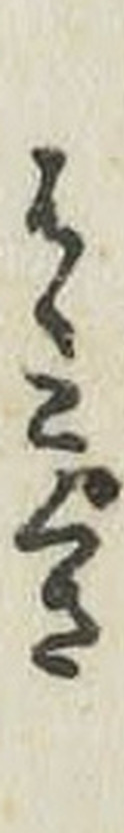はゝこぐさ
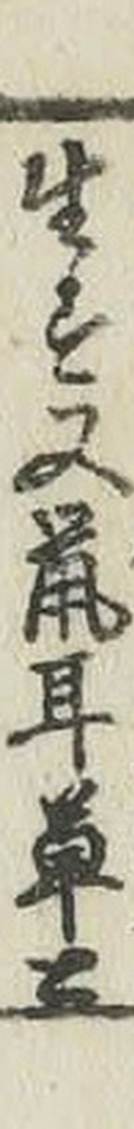生す又鼠耳草と
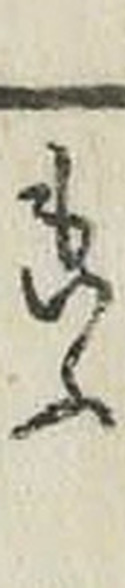もいふ
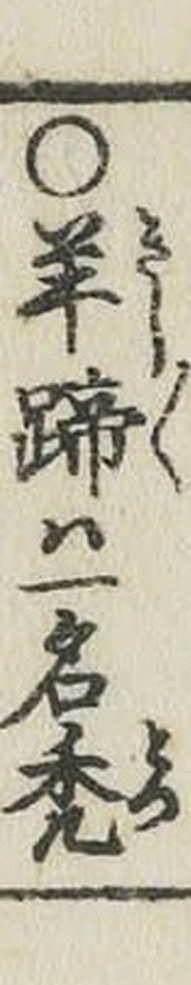○羊蹄は一名禿
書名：増補頭書訓蒙図彙大成 10巻 9:巻之20
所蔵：東京学芸大学教育コンテンツアーカイブ
